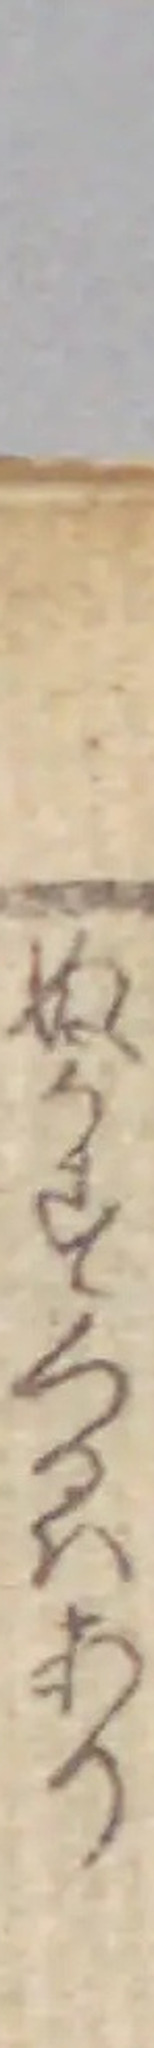ぬかすくるはあり
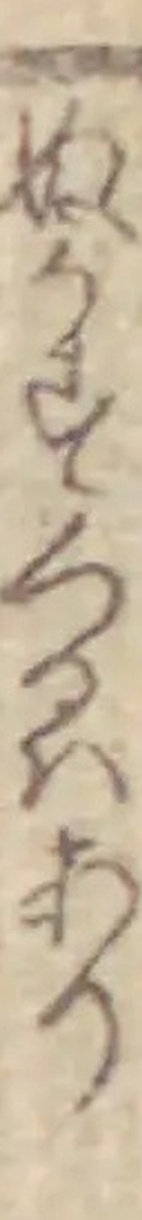ぬかすくるはあり
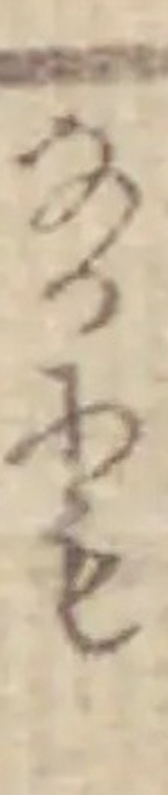なかにも
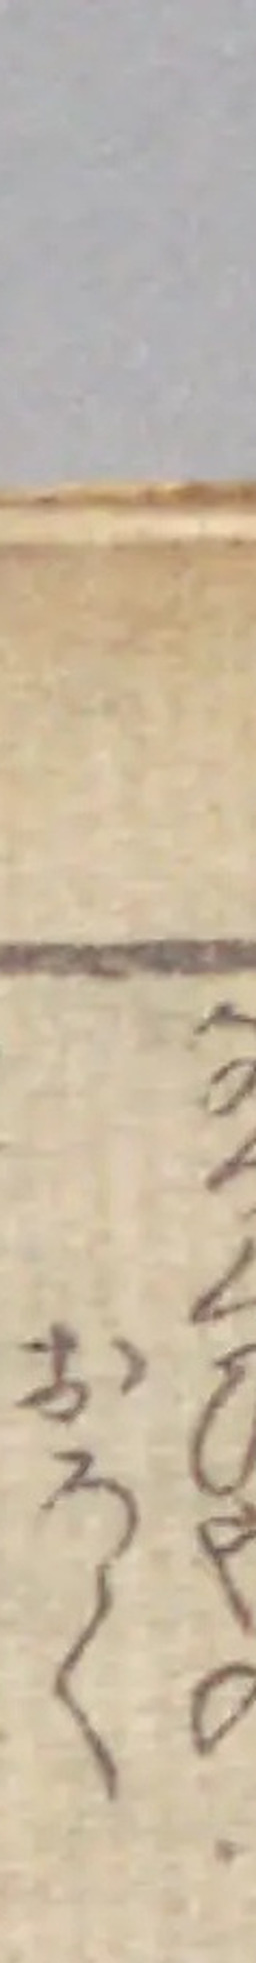おろく
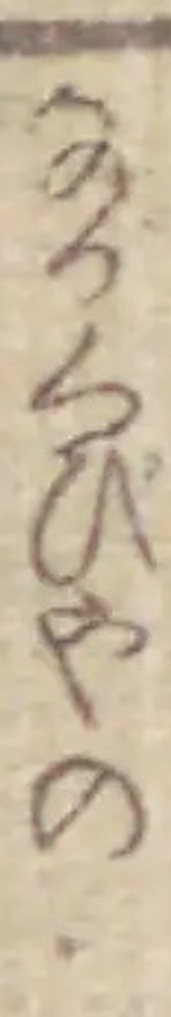なかくびやの
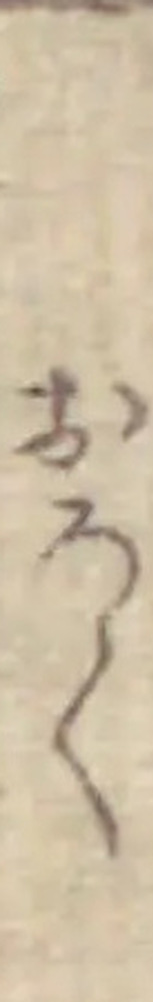おろく
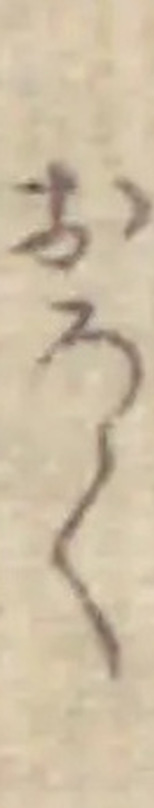おろく
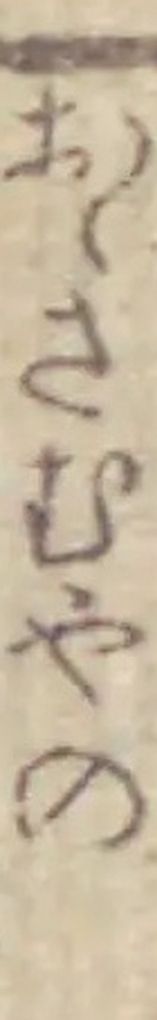おゝさむやの
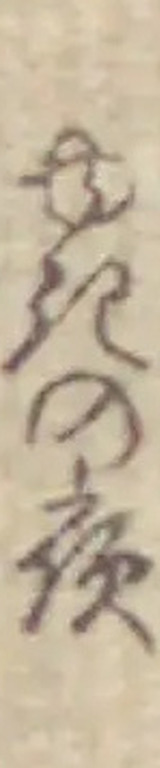ゆきの夜
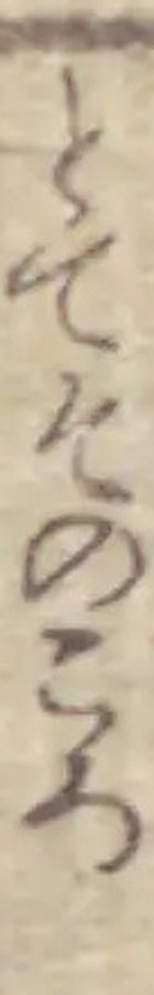とてそのころ
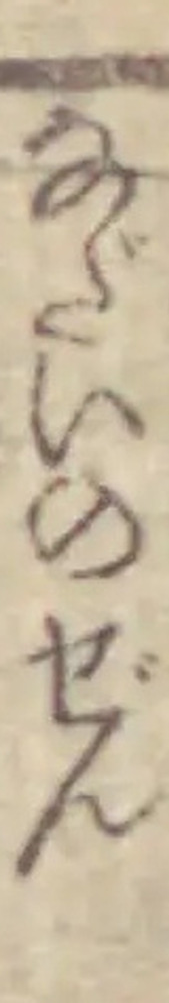なだいのぜん
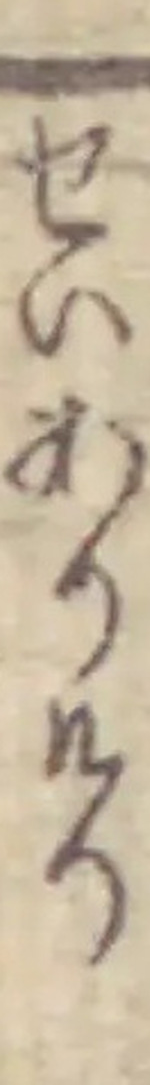せいありけり
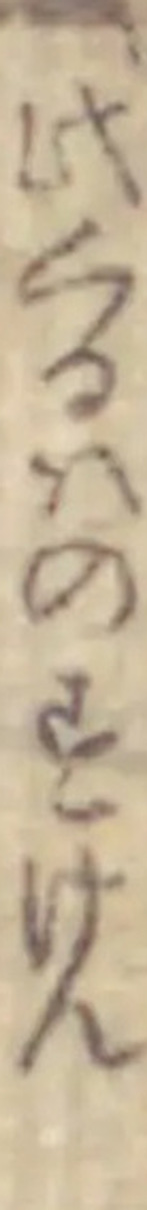此くるはのすけん
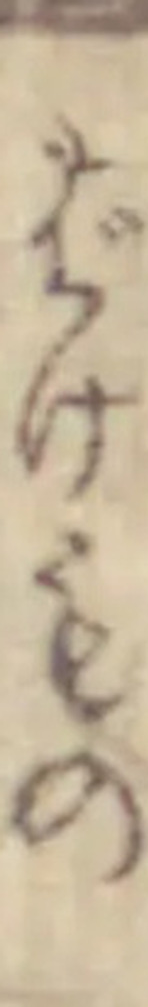ばけもの
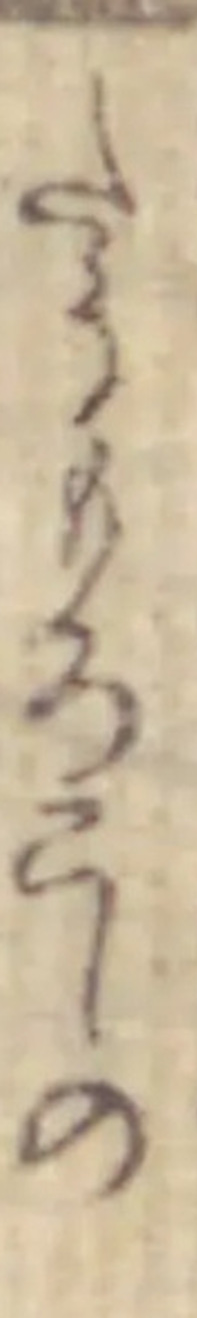たるもろこしの
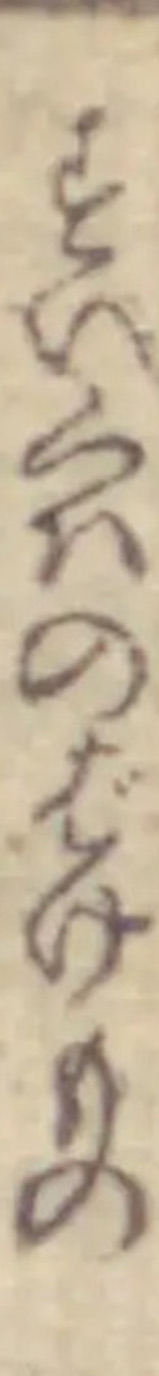すいくはのばけもの
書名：大昔化物双紙 2巻
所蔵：国立国会図書館 National Diet Library, JAPAN
